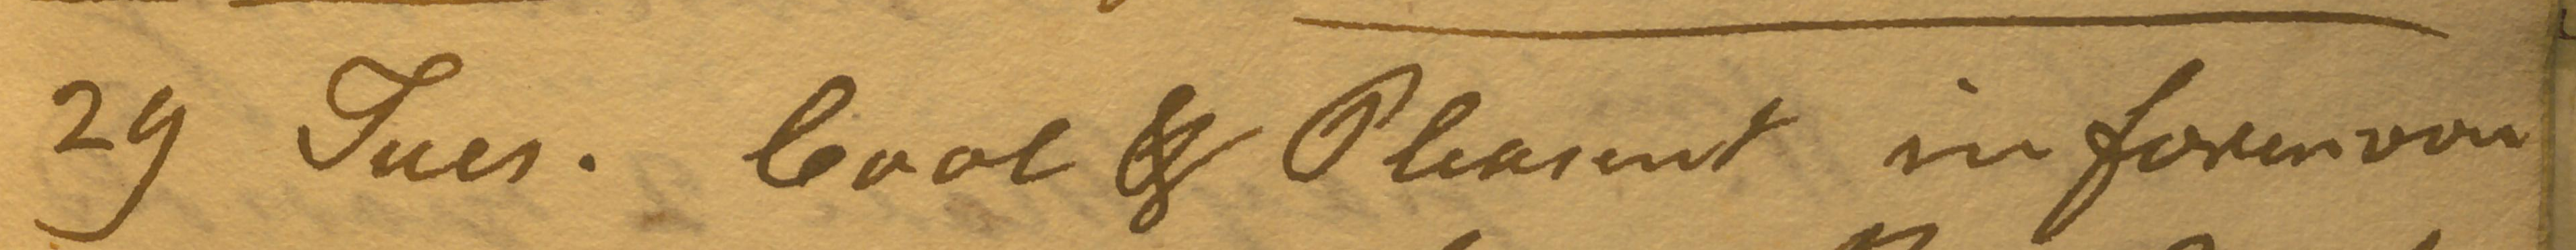29 Tues. Cool & Pleasent in forenoon
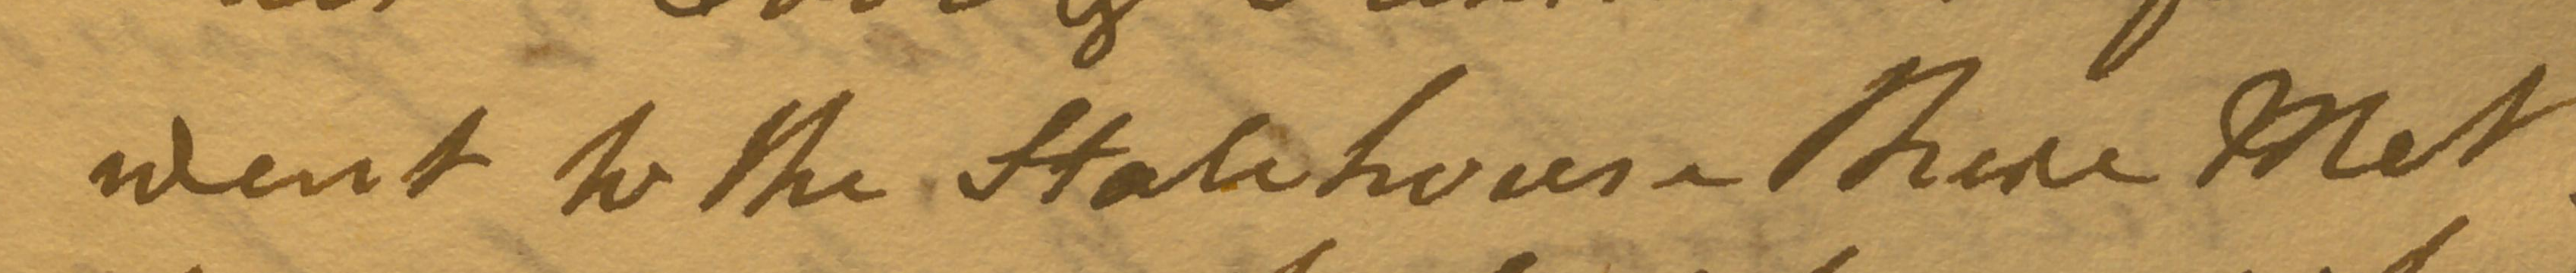went to the State house there Met
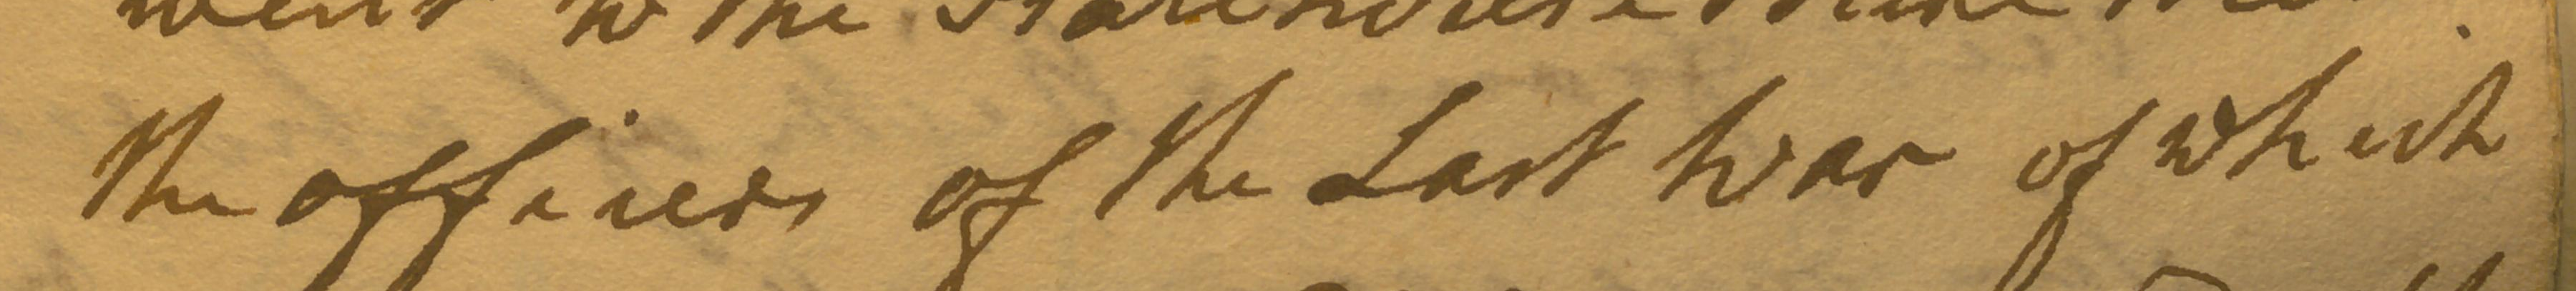the officers of the Last war of which
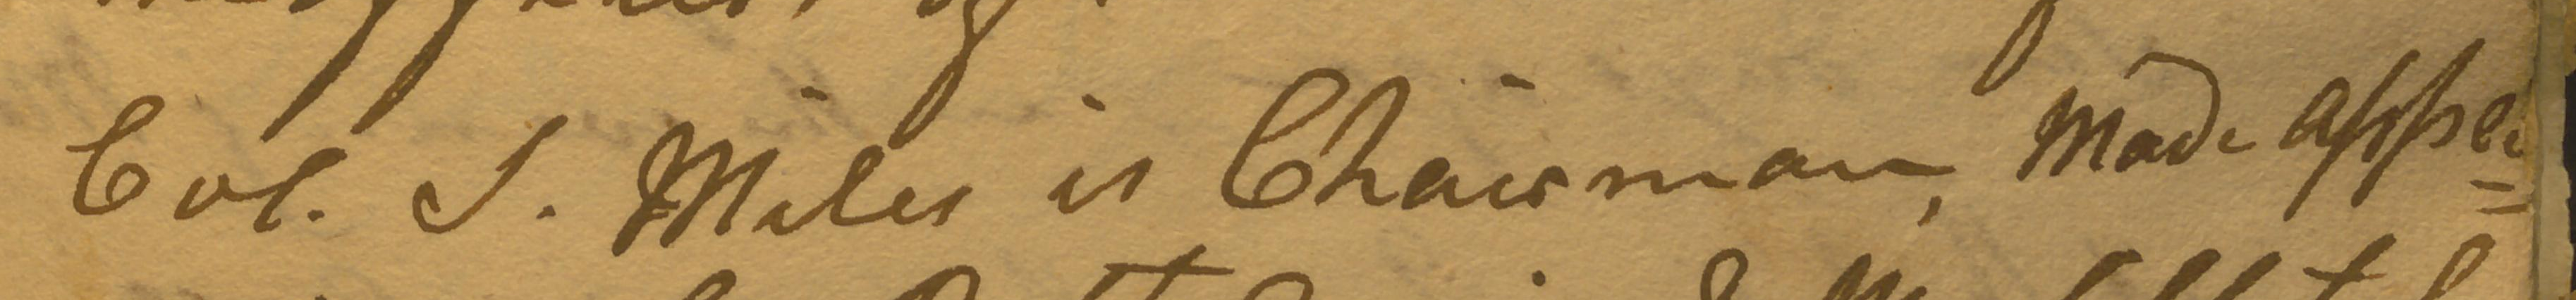Col. S. Miles is Chairman Made Appli-
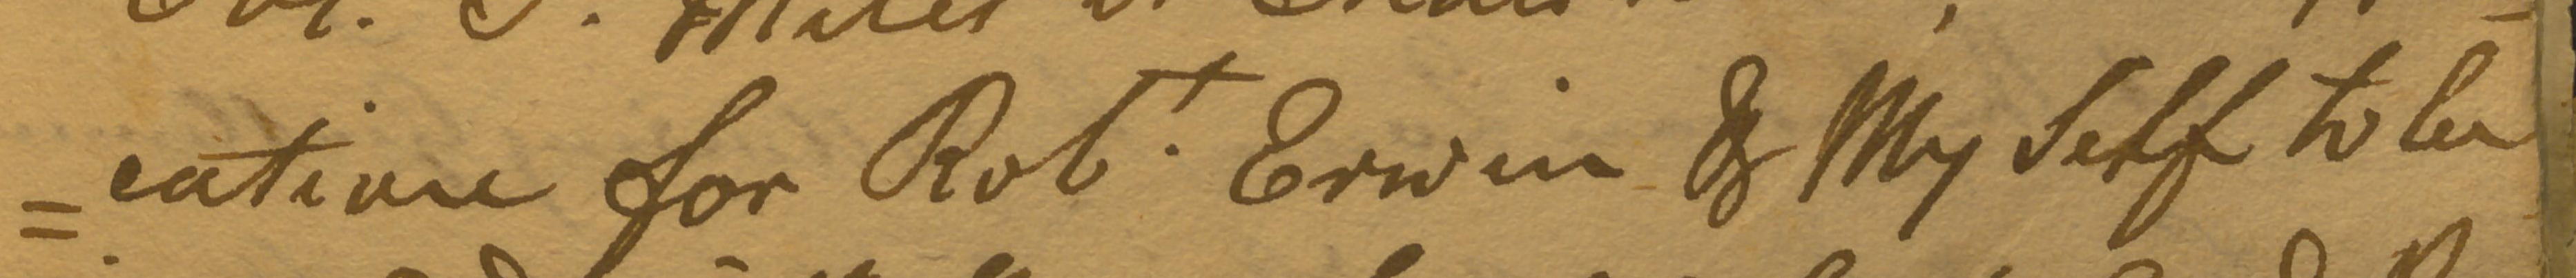cation for Rob^t. Erwin & My self to be
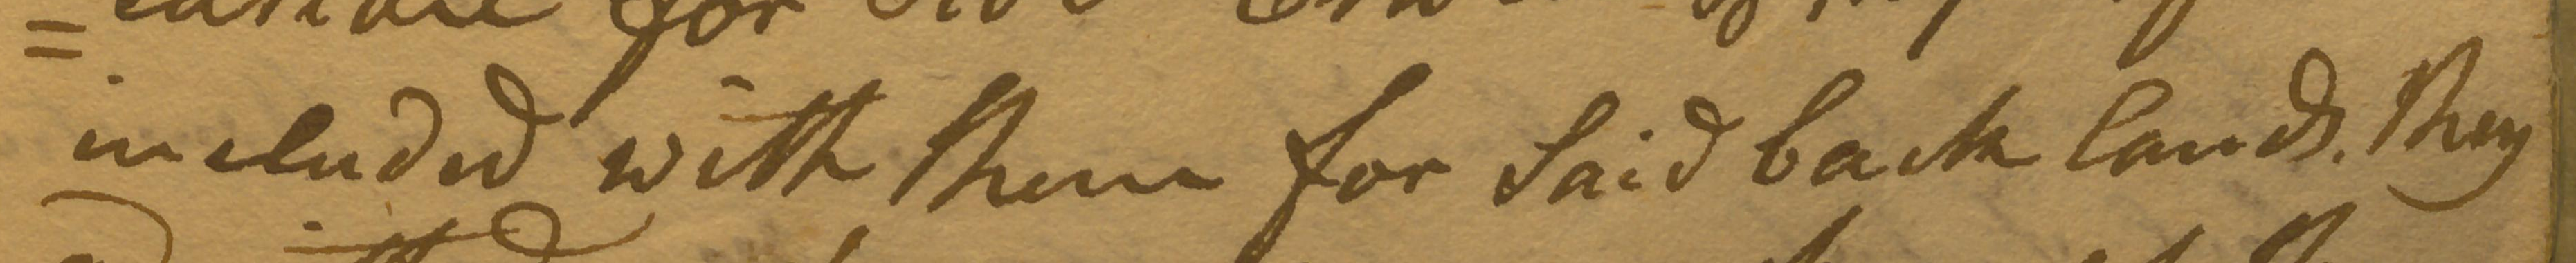iniluded with them for said back lands they
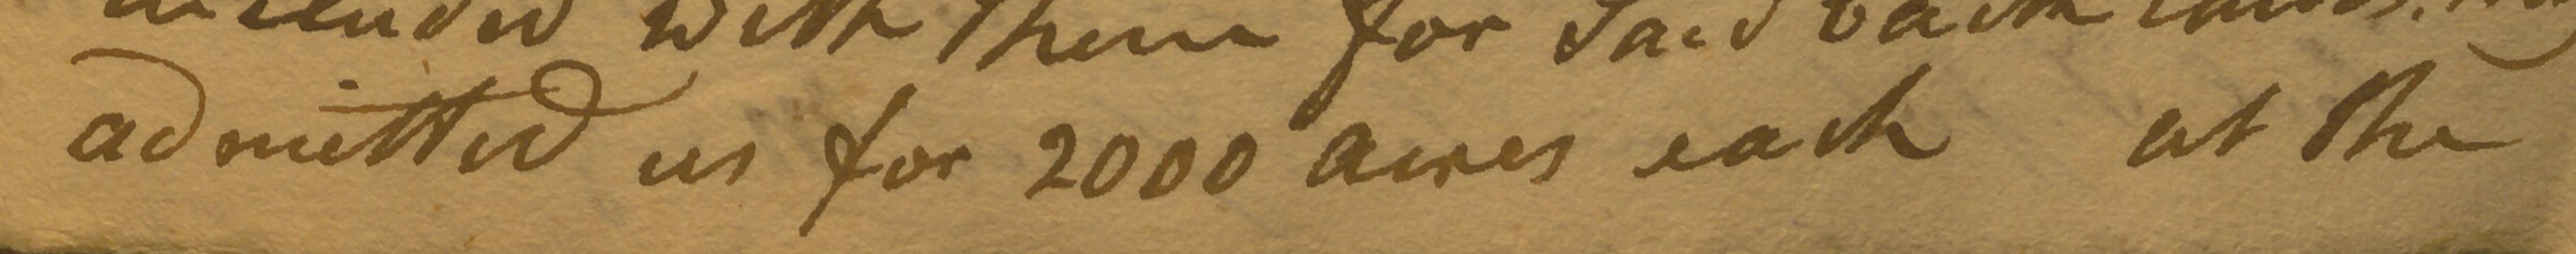admitted us for 2000 acres cack at the
